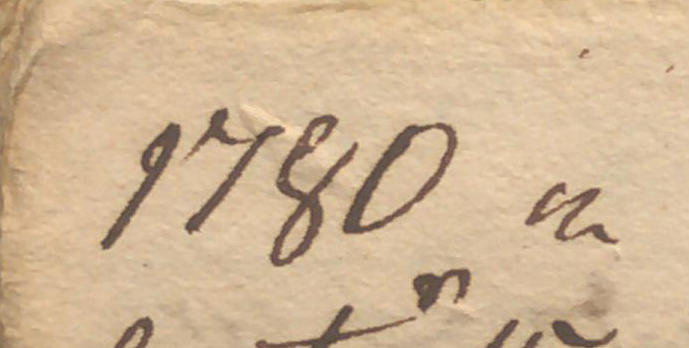1780
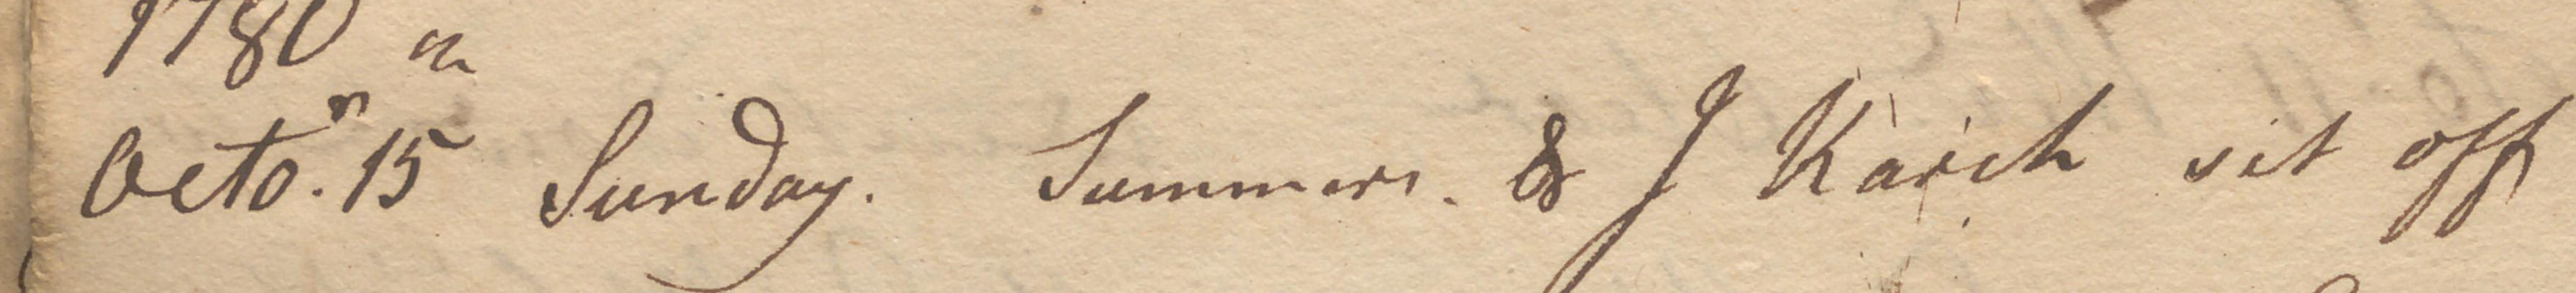Octo^r. 15^th Sunday. Summers & J Karch set off
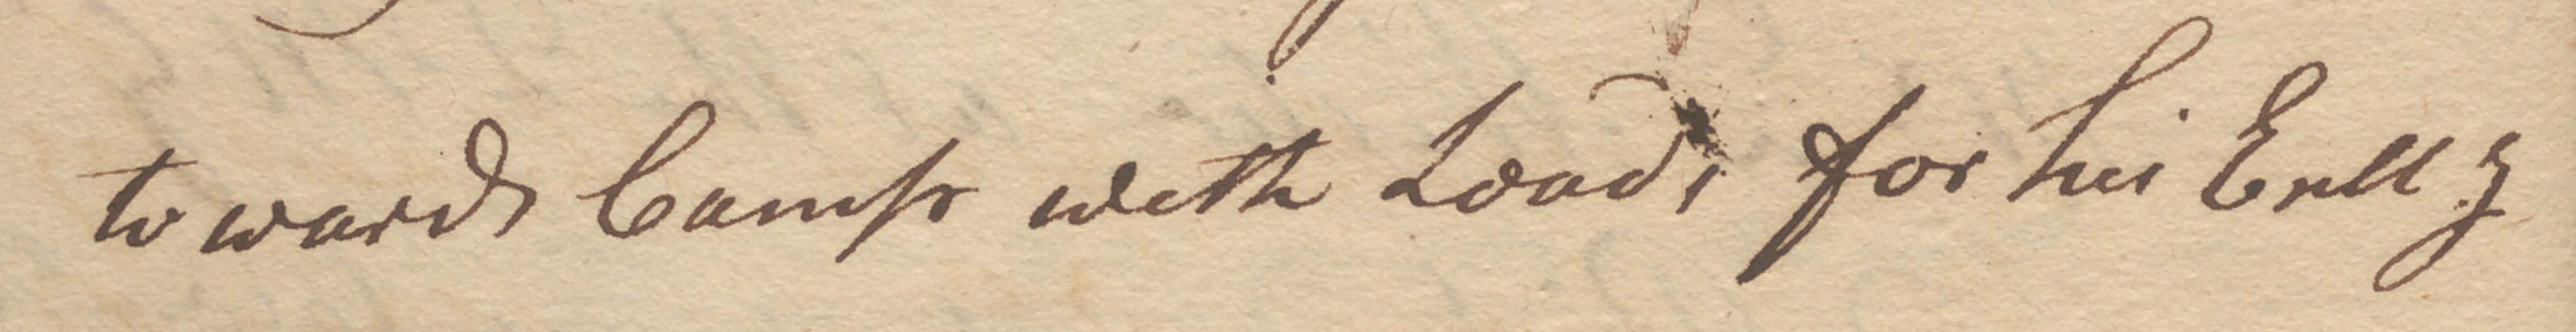to wards Camp with Loads for his Exll^y.
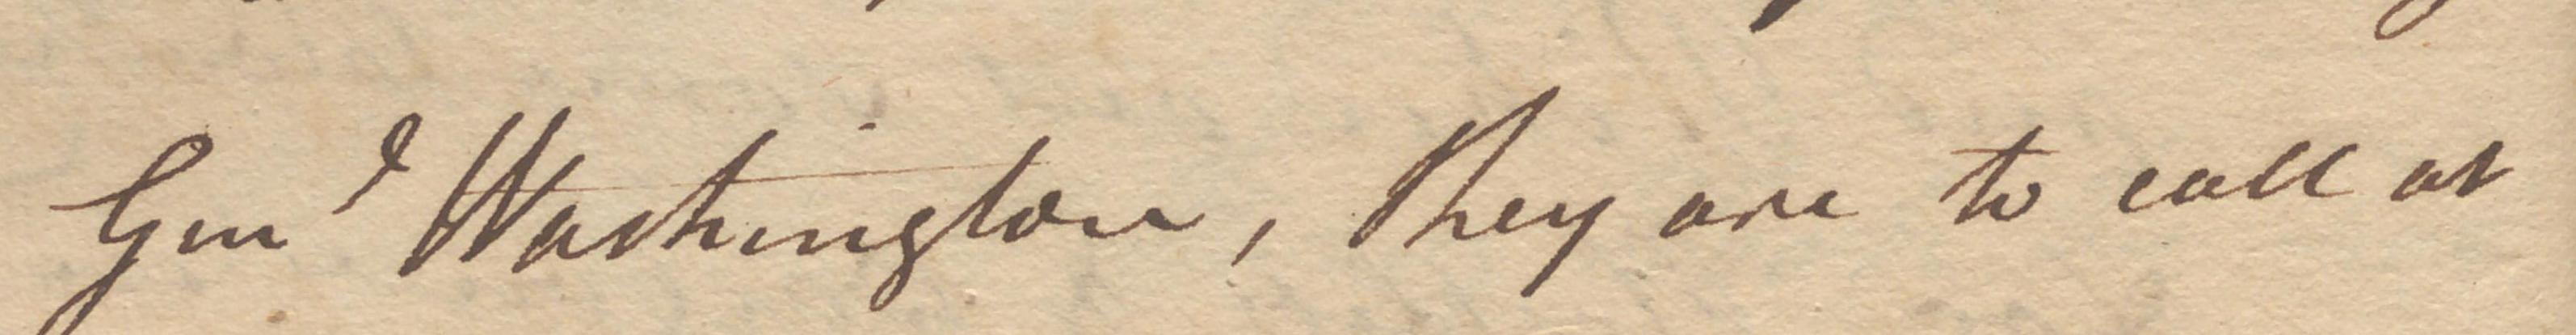Gen^l. Washington, they are to call at
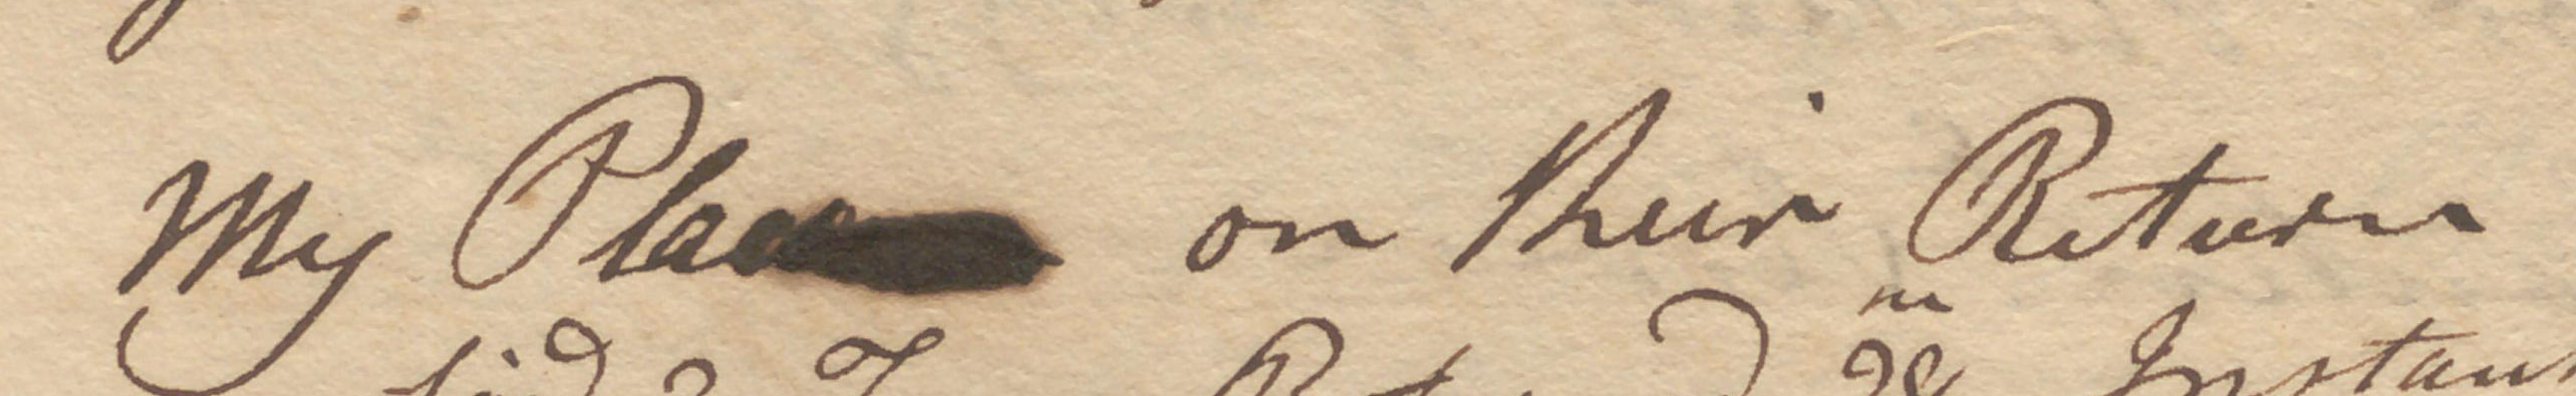My Place on their Return
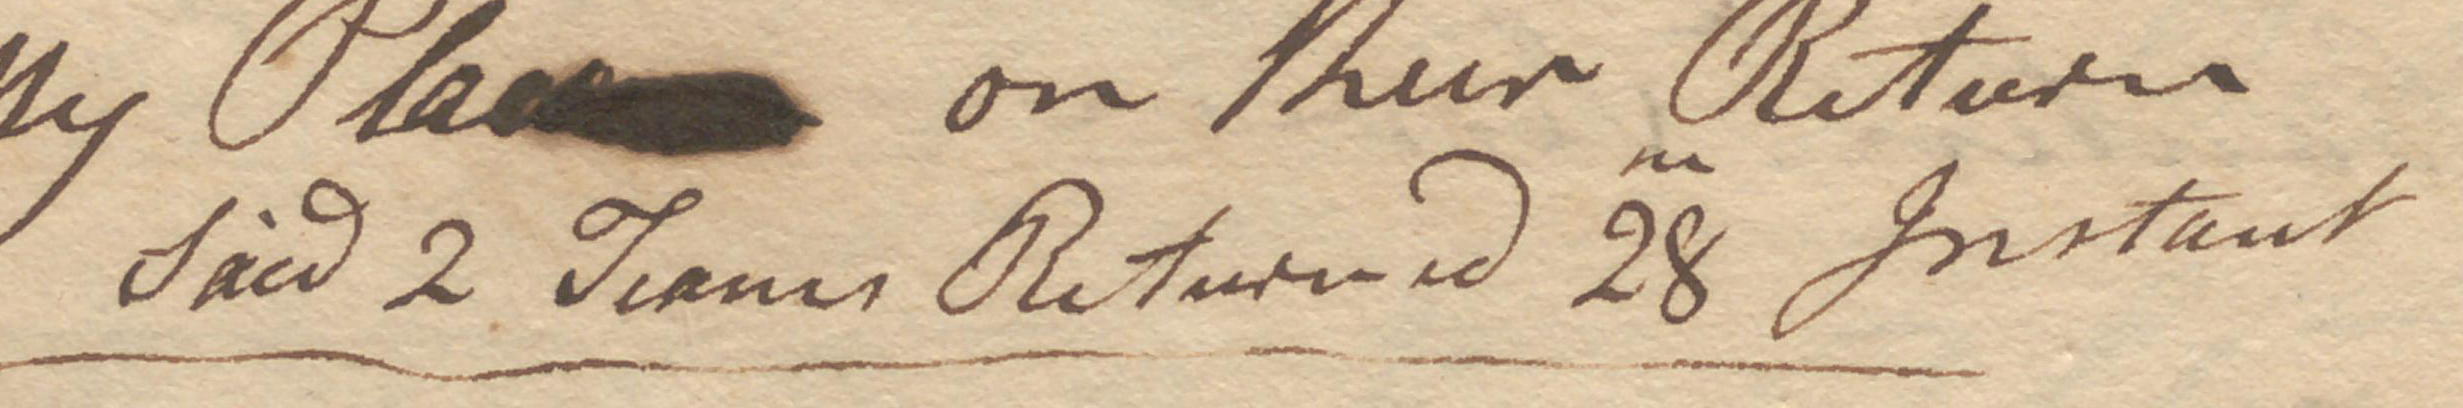Said 2 Teams Returned 28^th Instant
